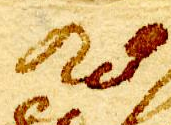Re^c
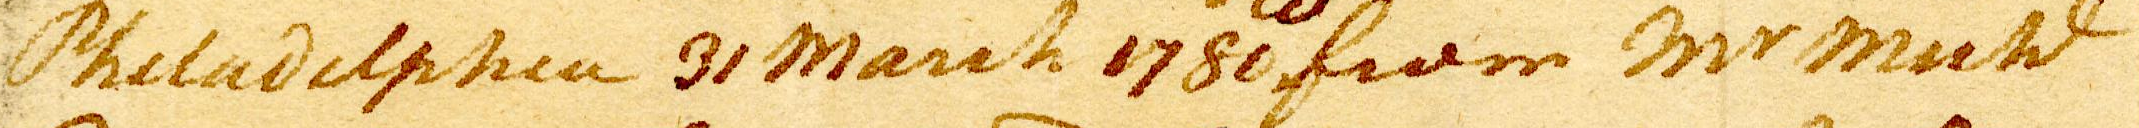Philadelphia 31 March 1780 from M^r Mich^l
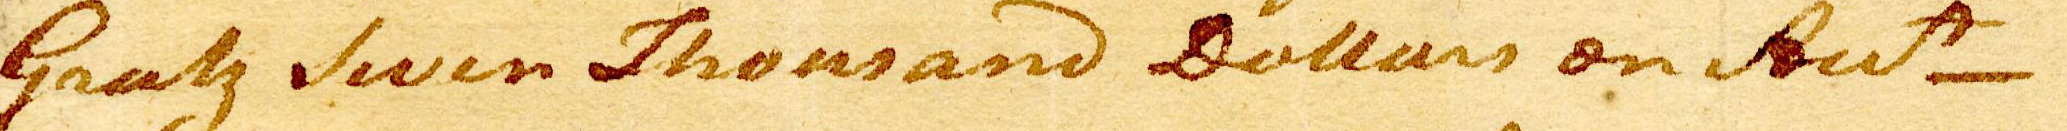Gratz Seven Thousand Dollars on Rec^t
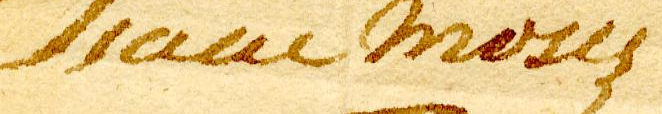Isaac Moses
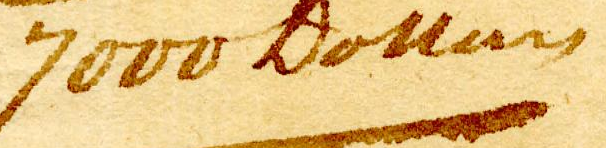7000 Dollars
